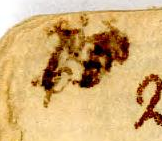60
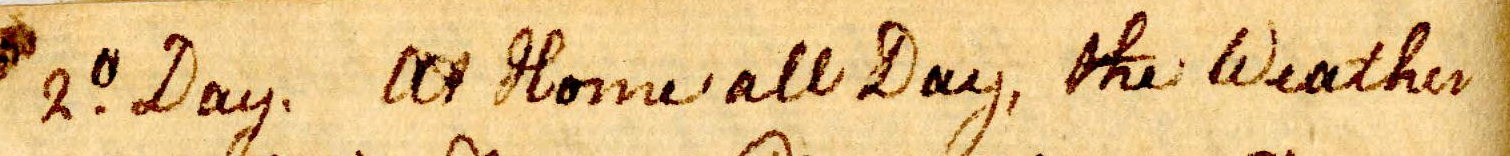2^d. Day. At Home all Day, the Weather
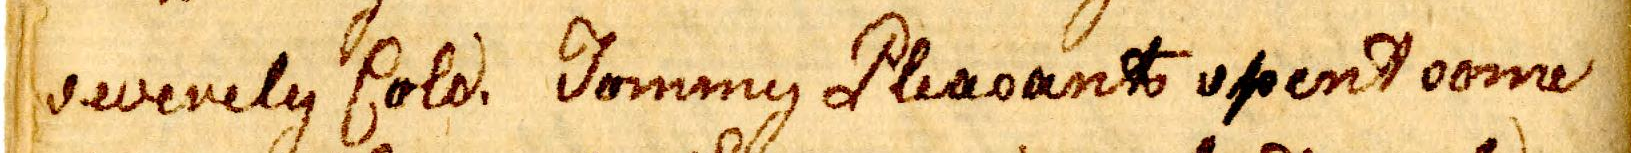severely Cold. Tommy Pleasants spent some
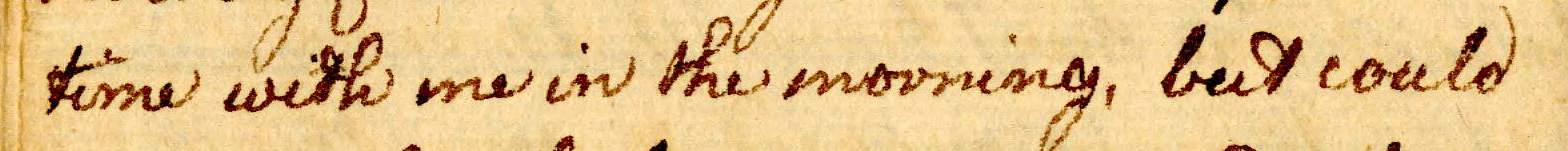time with me in the morning, but could
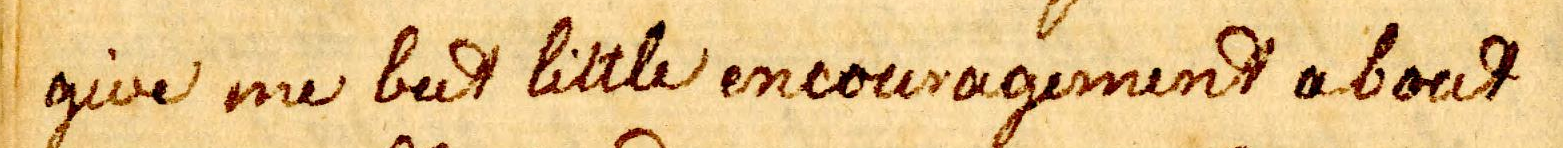give me but little encouragement about
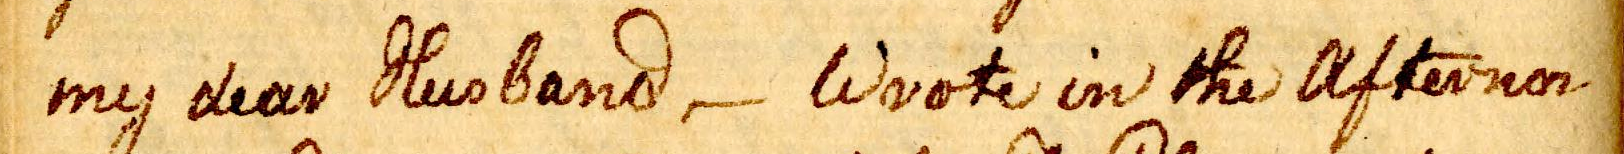my dear Husband- Wrote in the Afternon
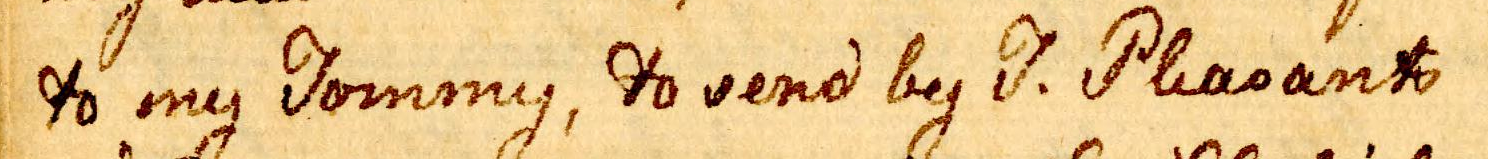to my Tommy, to send by T. Pleasants
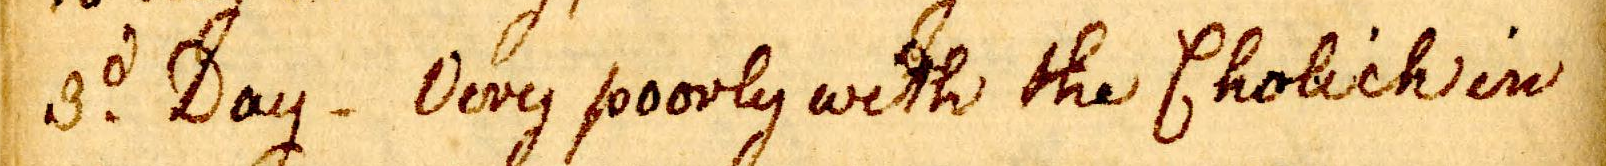3^d. Day- Very poorly with the Cholick in
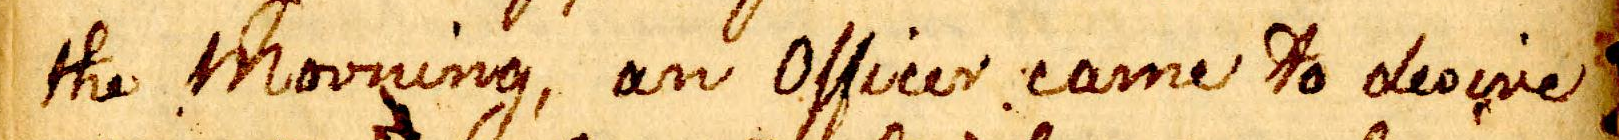the Morning, an Officer came to desire
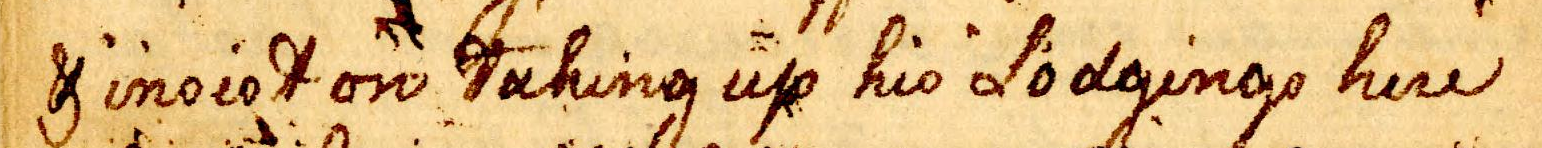& insist on taking up his Lodgings here
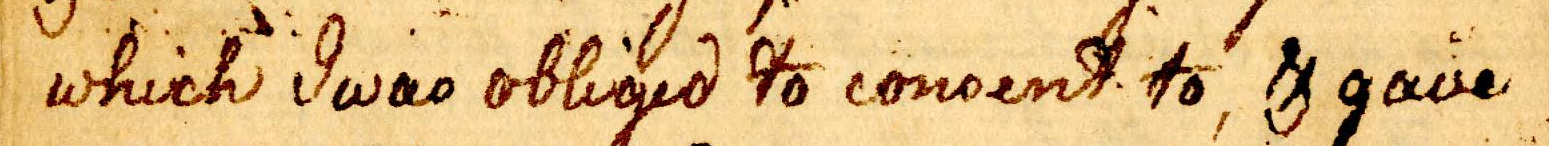which I was obliged to consent to & gave
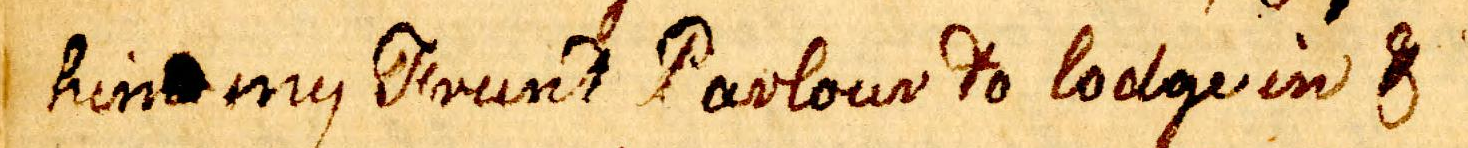him my Frunt Parlour to lodge in &
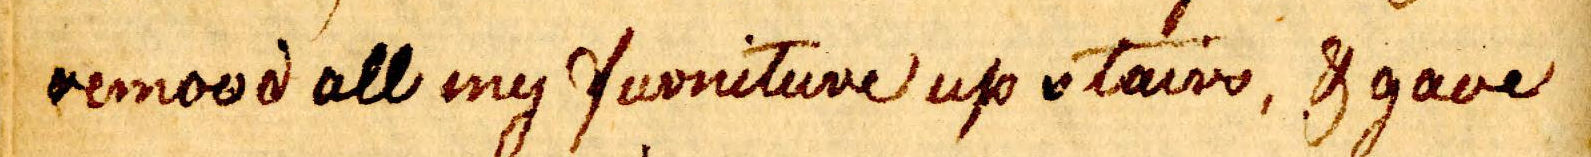removd all my furniture up stairs, & gave
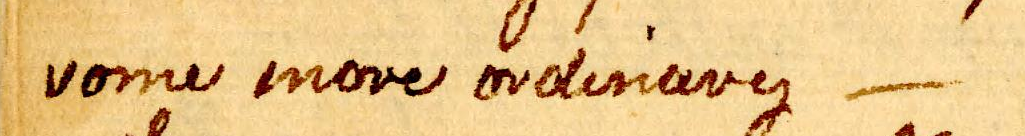some more ordinary-
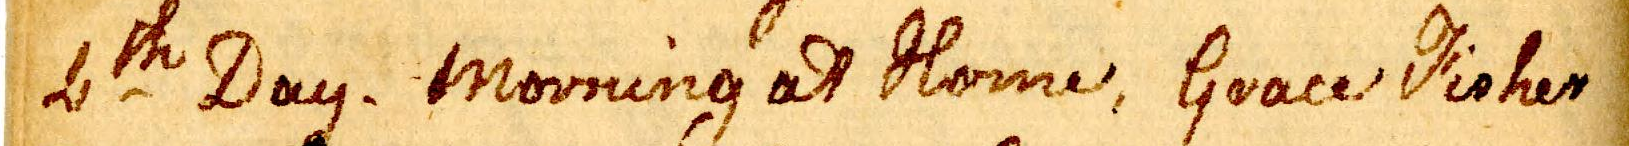4^th Day- Morning at Home, Grace Fisher
